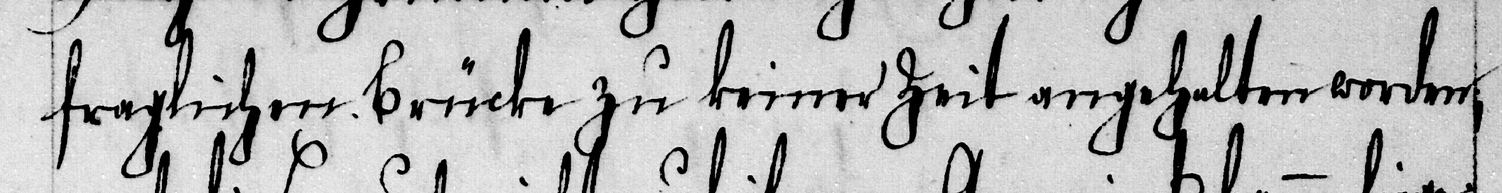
fraglichen Brücke zu keiner Zeit angehalten worden;
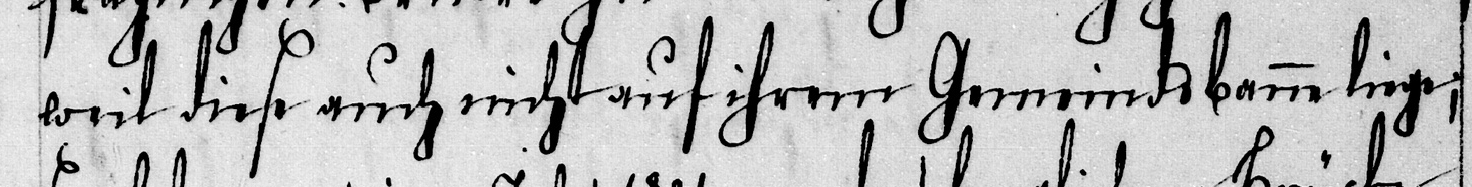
weil diese auch nicht auf ihrem Gemeindsbanne liege;
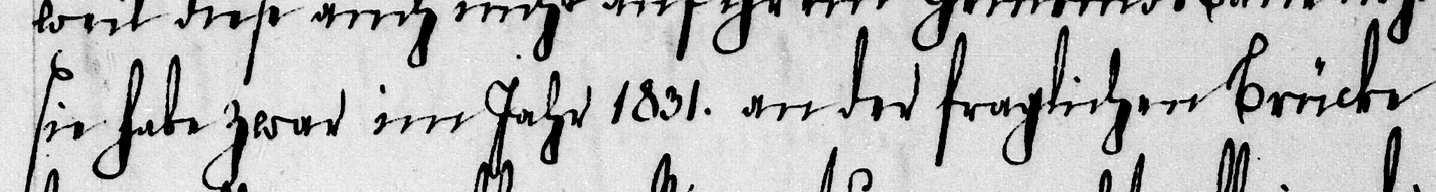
sie habe zwar im Jahr 1831. an der fraglichen Brücke
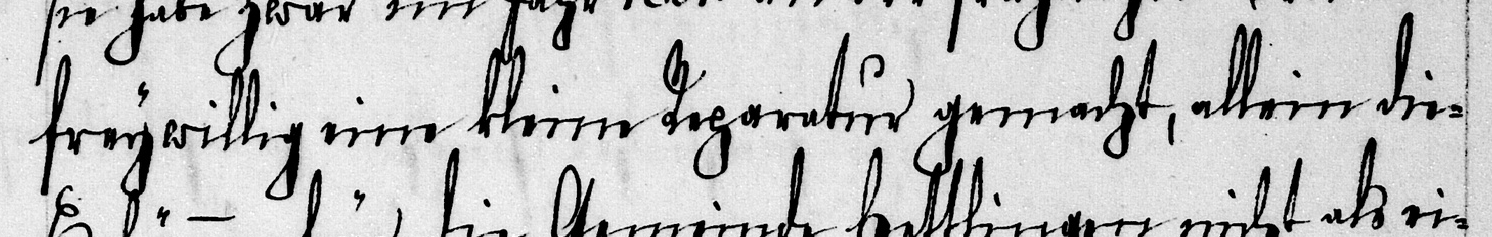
freywillig eine kleine Reparatur gemacht, allein die¬
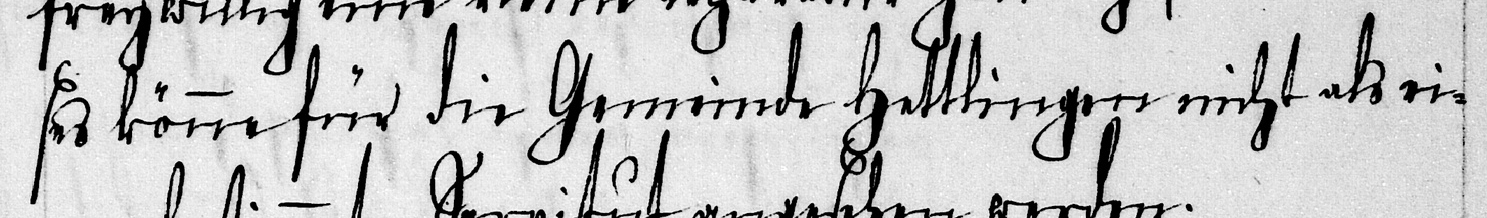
ses könne für die Gemeinde Hettlingen nicht als ei¬
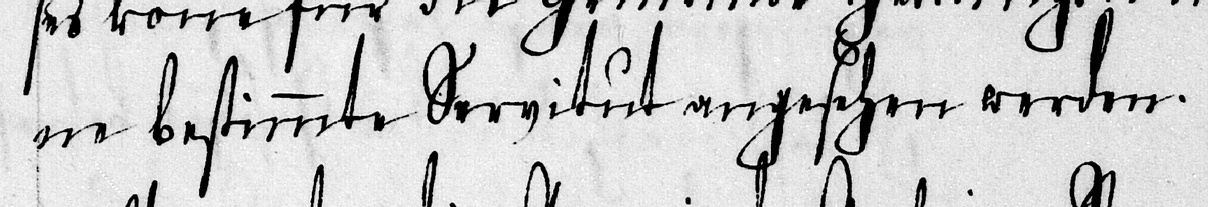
ne bestimmte Servitut angesehen werden.
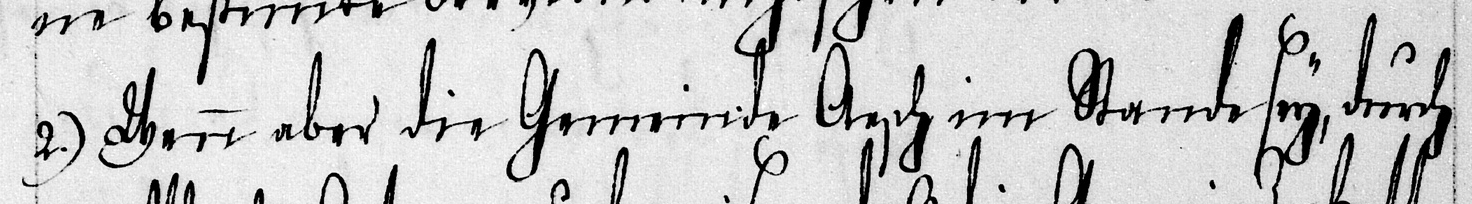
2.) Wenn aber die Gemeinde Aesch im Stande sey, durch
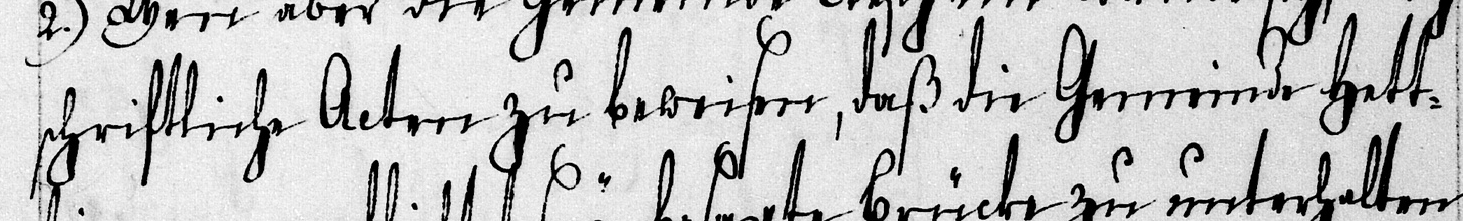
schriftliche Acten zu beweisen, daß die Gemeinde Hett¬
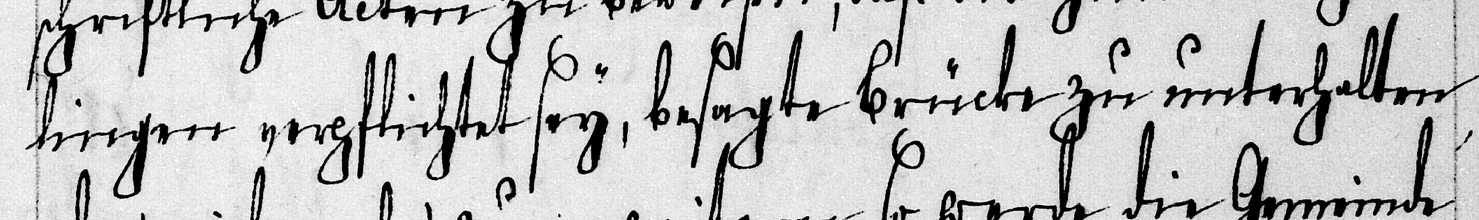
lingen verpflichtet sey, besagte Brücke zu unterhalten
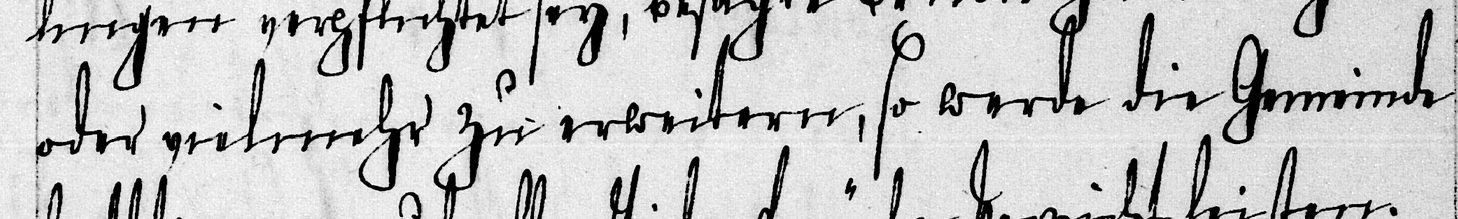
oder vielmehr zu erweitern, so werde die Gemeinde
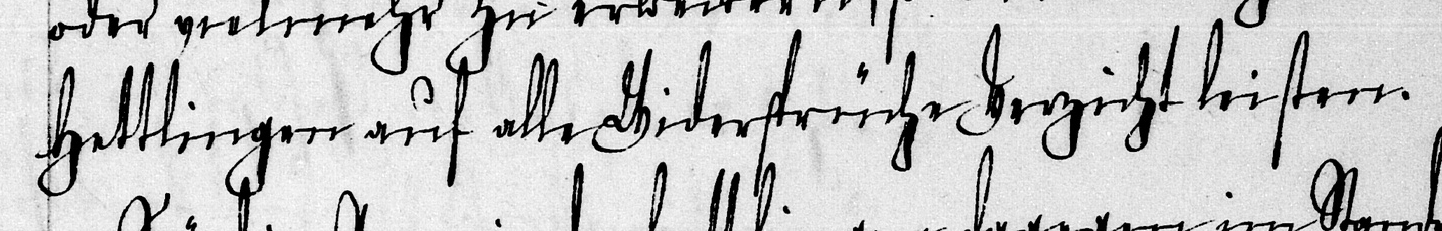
Hettlingen auf alle Widersprüche Verzicht leisten.
